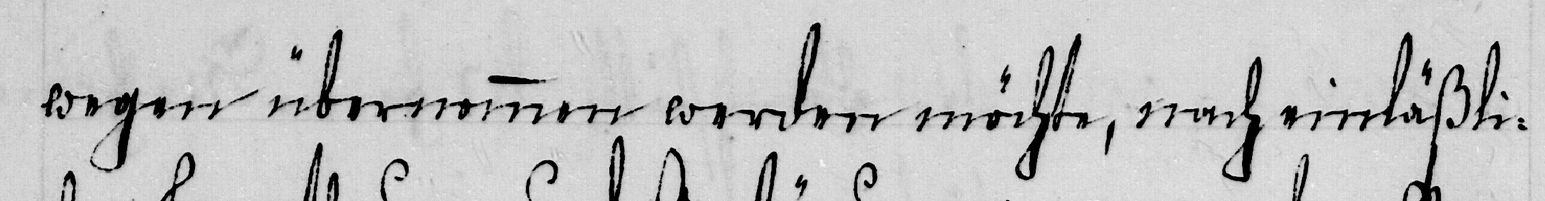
wegen übernommen werden möchte, nach einläßli¬
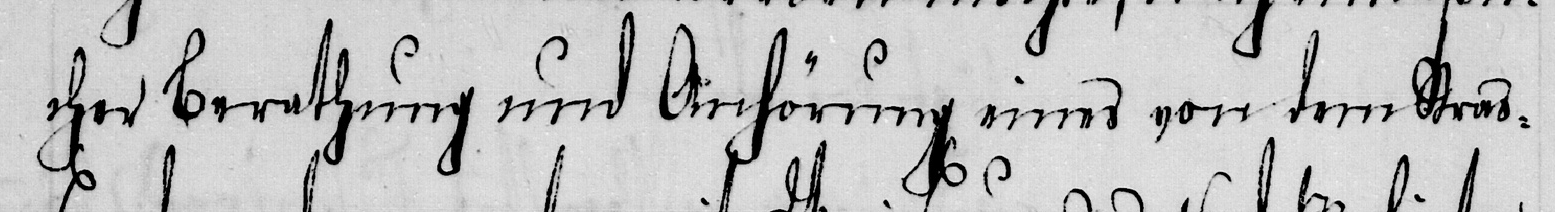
cher Berathung und Anhörung eines von dem Straß¬
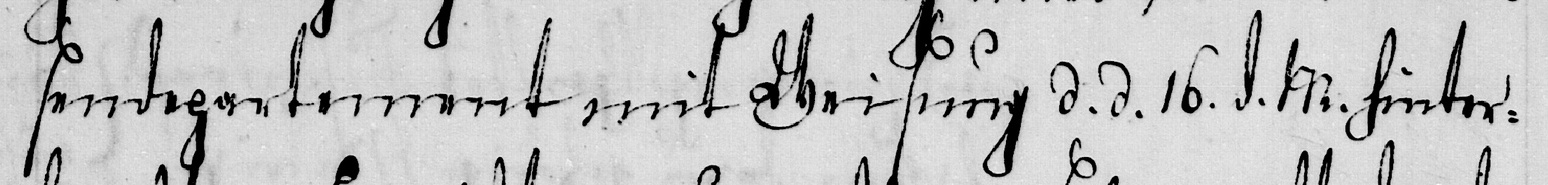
endepartement mit Weisung d. d. 16. d. M. hinter¬
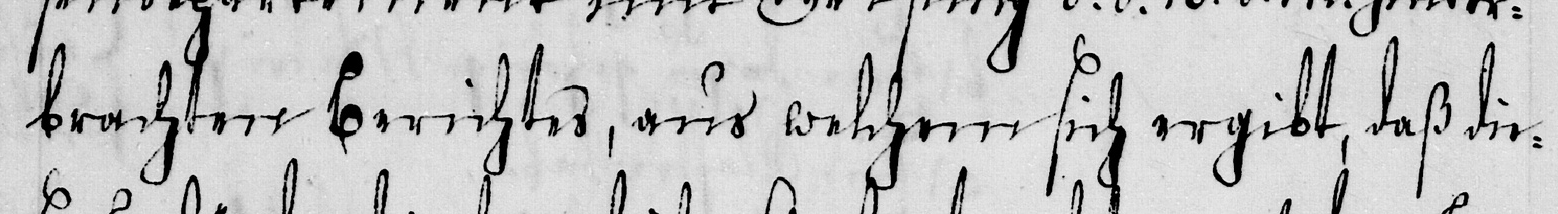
brachten Berichtes, aus welchem sich ergibt, daß di¬
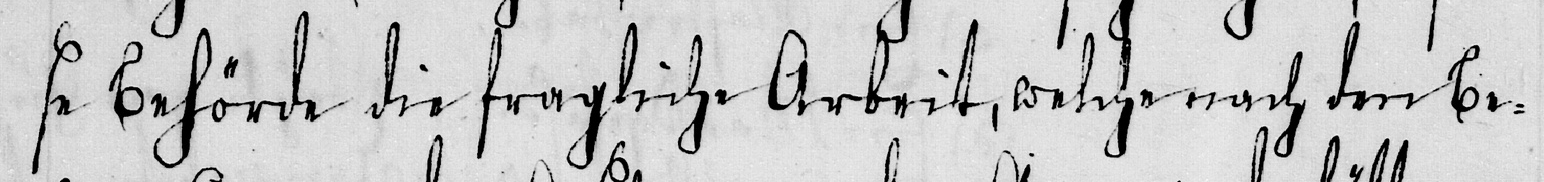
ese Behörde die fragliche Arbeit, welche nach den Be¬
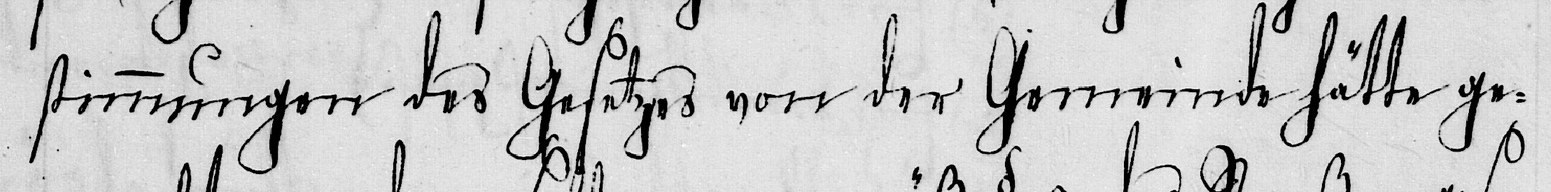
stimmungen des Gesetzes von der Gemeinde hätte ge¬
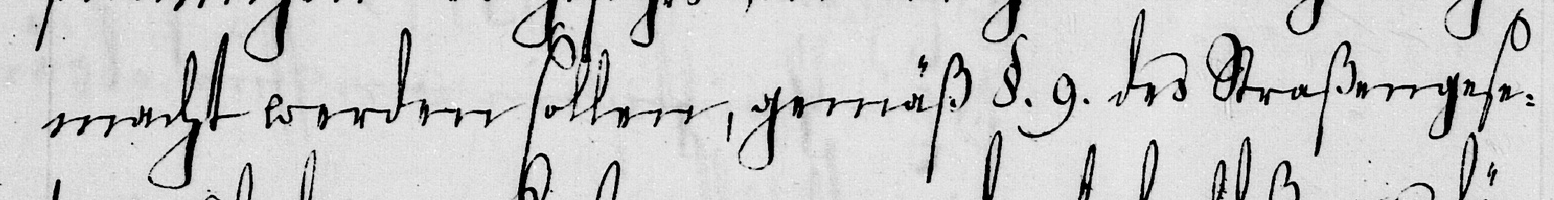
macht werden sollen, gemäß §. 9. des Straßengese¬
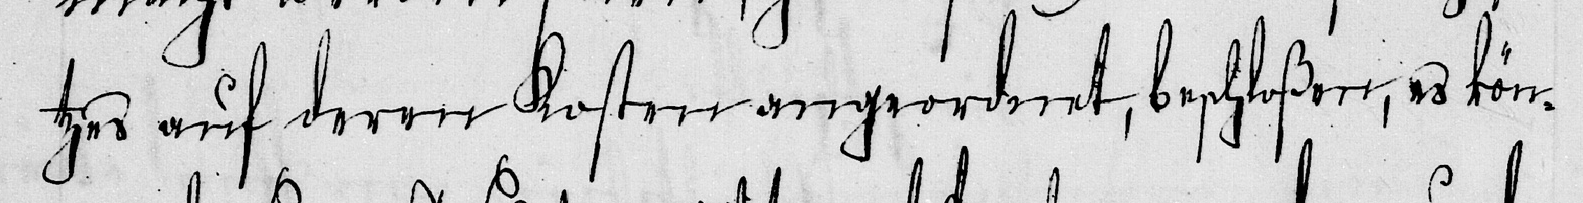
tzes auf deren Kosten angeordnet, beschloßen, es kön¬
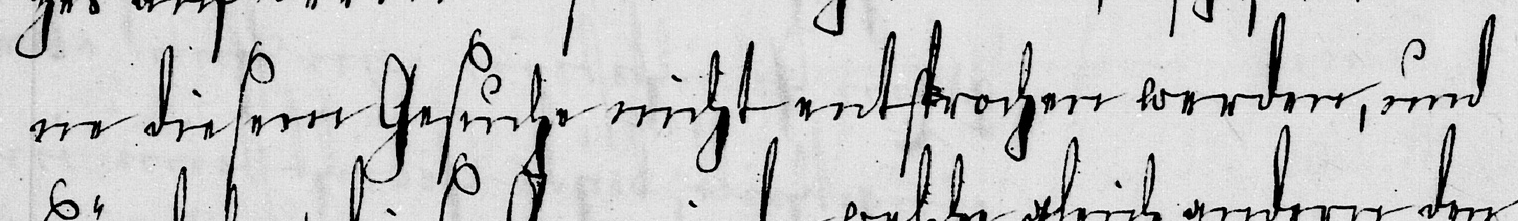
ne diesem Gesuche nicht entsprochen werden, und
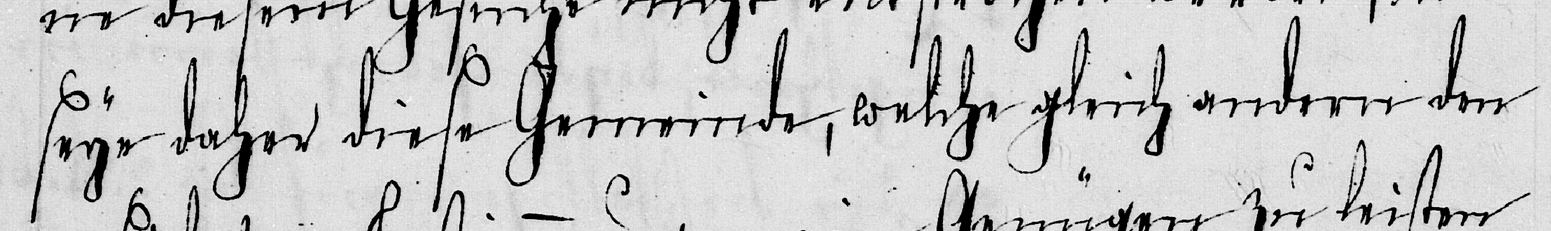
seye daher diese Gemeinde, welche gleich andern den
